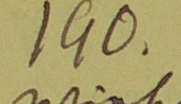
190
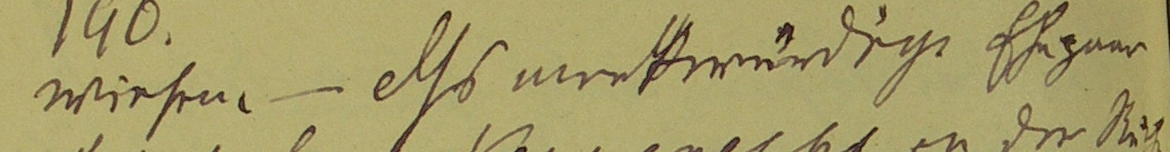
gewiesen. Dieses merkwürdige Ehepaar
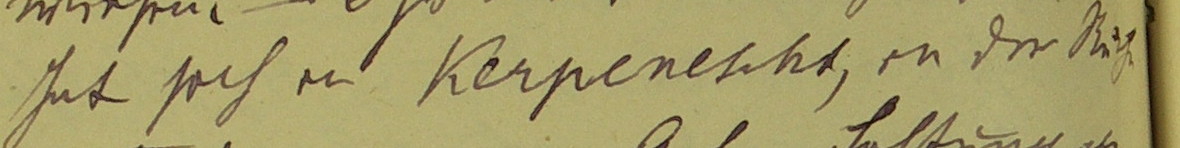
hat sich in Kerpenesekt, in der Nähe
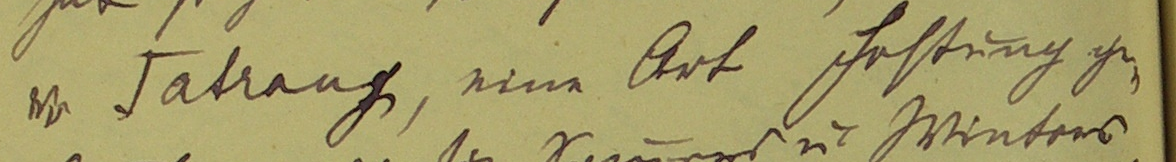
von Tatrang, eine Art Festung ge¬
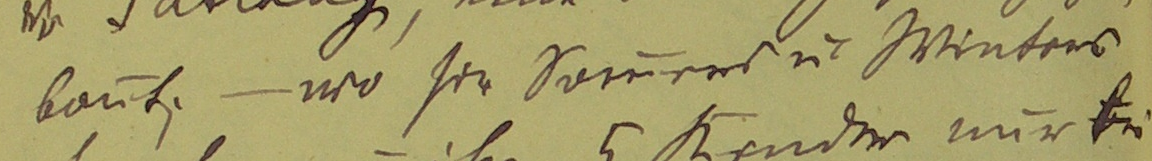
baut.- wo sie Sommer und Winter
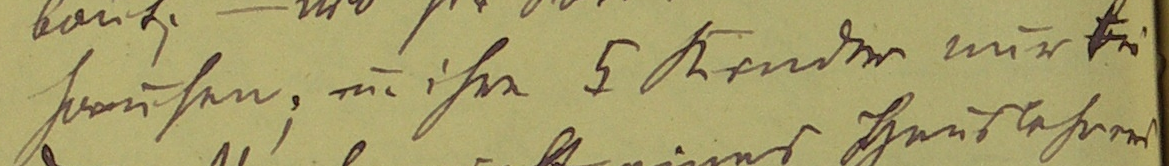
hausen,-- und ihre 5 Kinder nur von
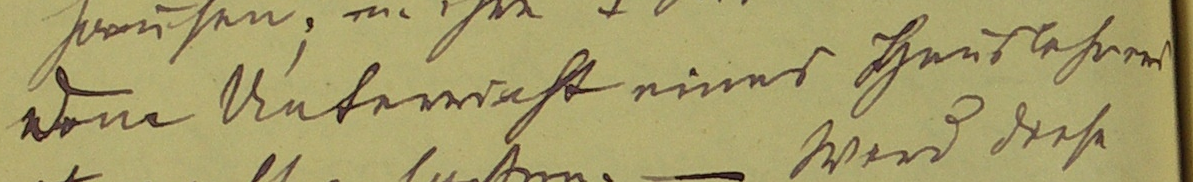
dem Unterricht eines Hauslehrers
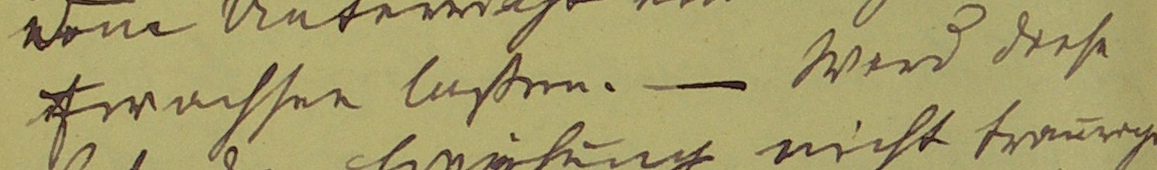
unterrichten laßen.—Wird diese
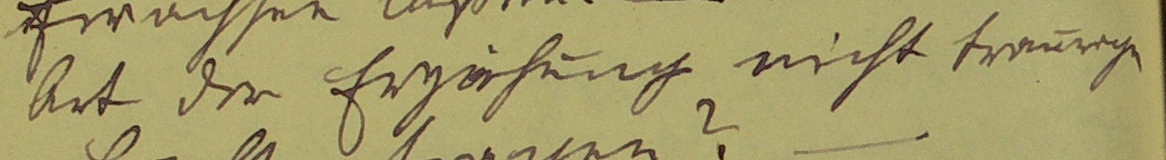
Art der Erziehung nicht traurige
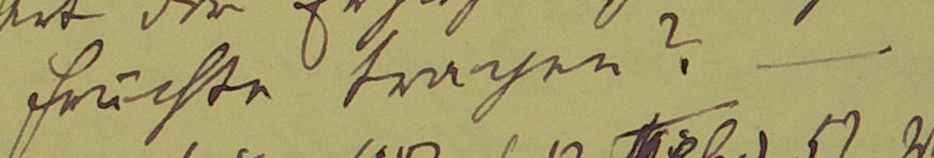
Früchte tragen ?.
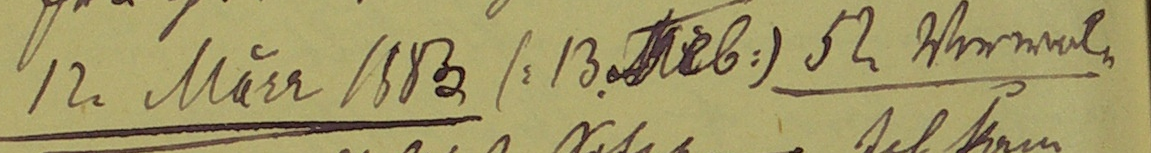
12. März 1883 ( :13 Febr.: ) 52 Verwal¬
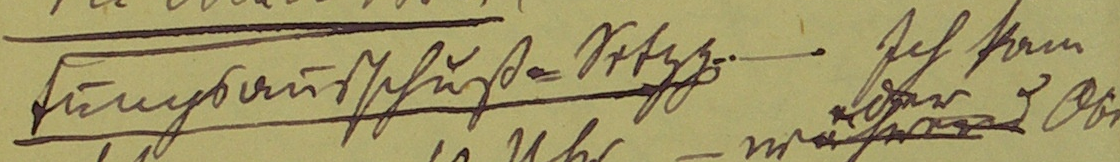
tungsausschuß-Sitzung- Ich kam
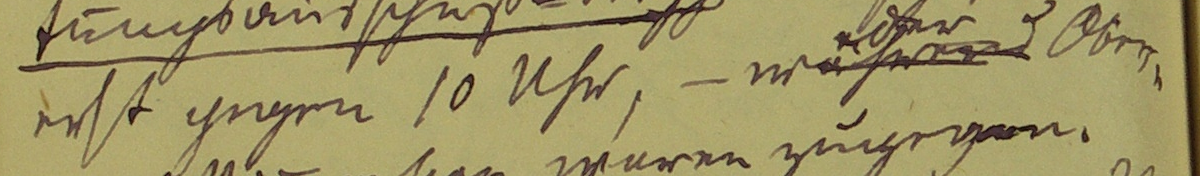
erst gegen 10 Uhr,- weder Ober¬
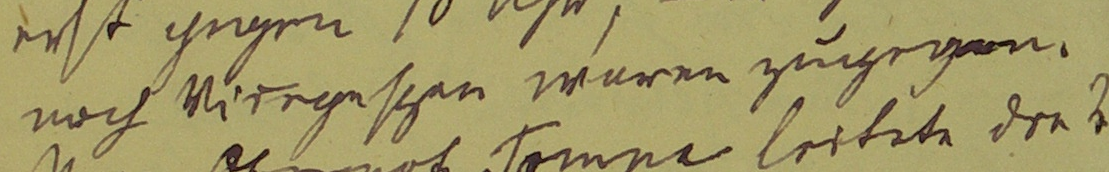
noch Vizegespann waren zugegen.
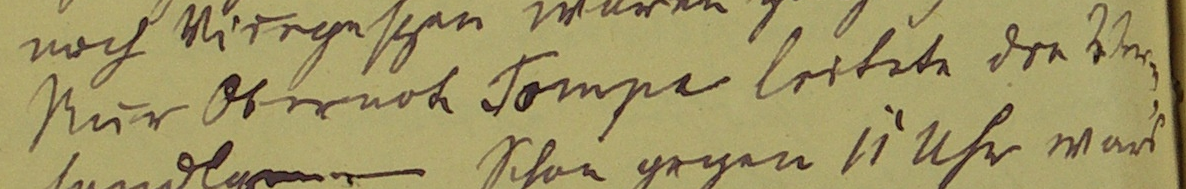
Nur Obernotar Tompa leitete die Ver¬
